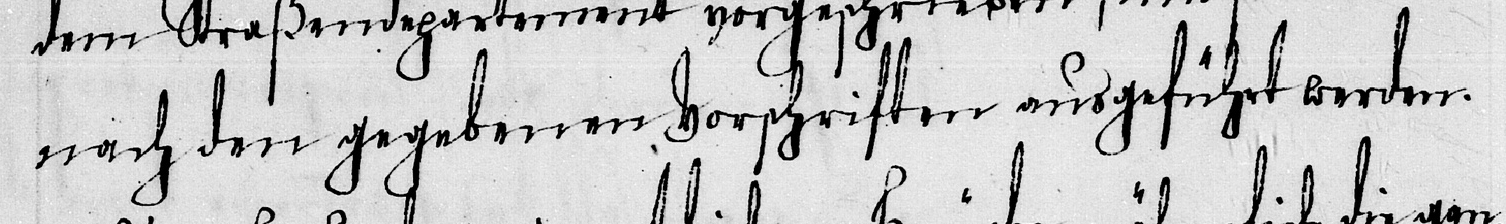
nach den gegebenen Vorschriften ausgeführt werden.
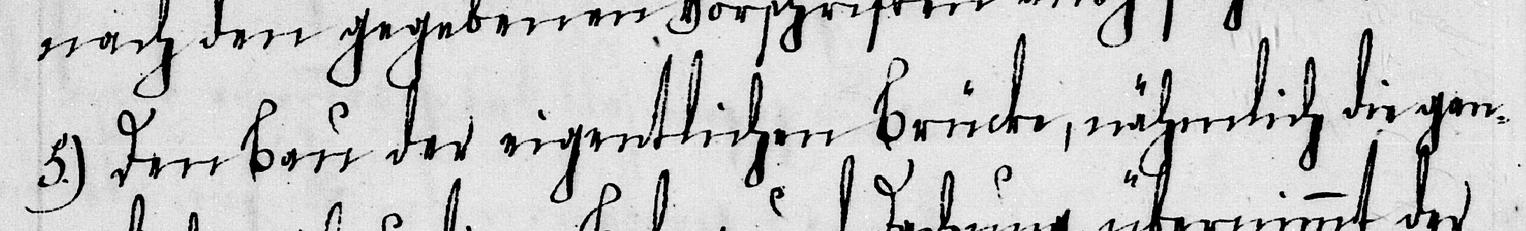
5.) Den Bau der eigentlichen Brücke, nähmlich die gan¬
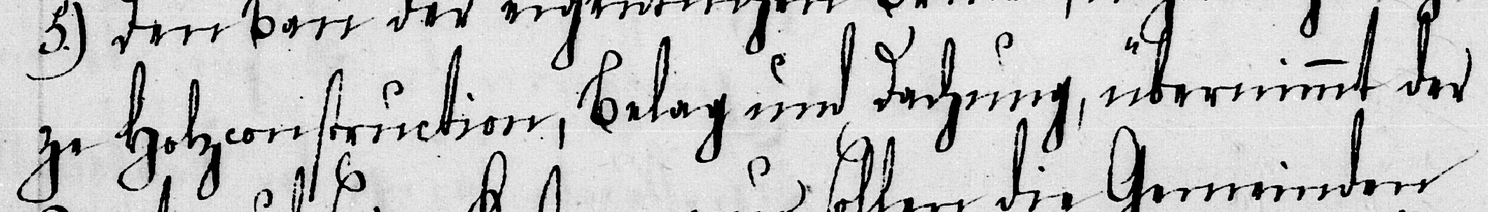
ze Holzconstruction, Belag und Dachung, übernimmt der
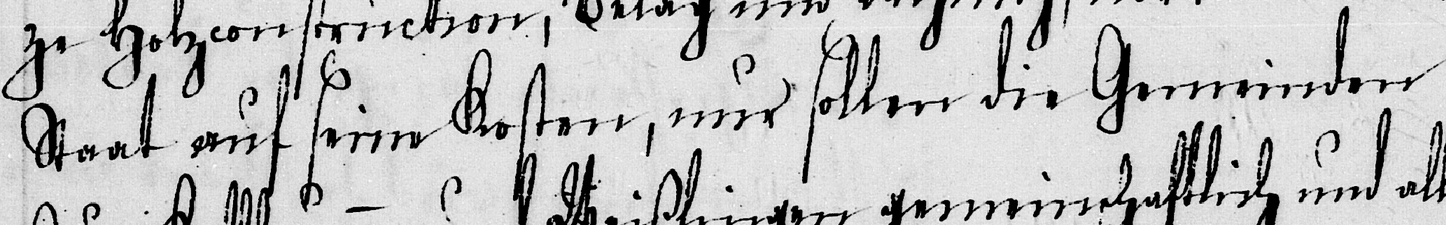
Staat auf seine Kosten, nur sollen die Gemeinden
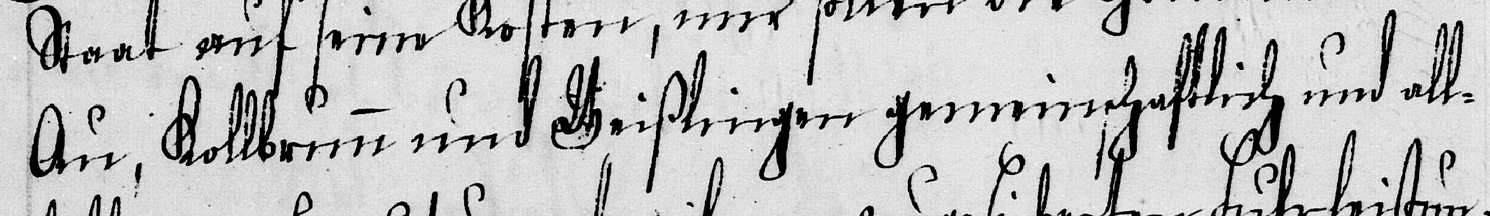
Au, Kollbrunn und Weißlingen gemeinschaftlich und al¬
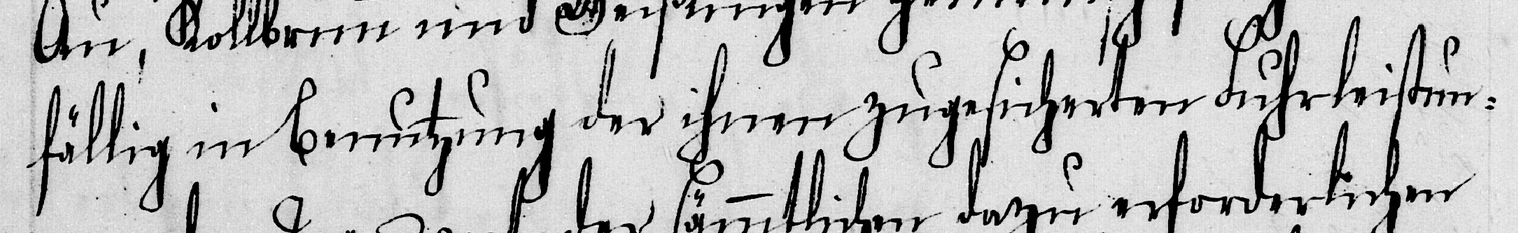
lfällig in Benutzung der ihnen zugesicherten Fuhrleistun¬
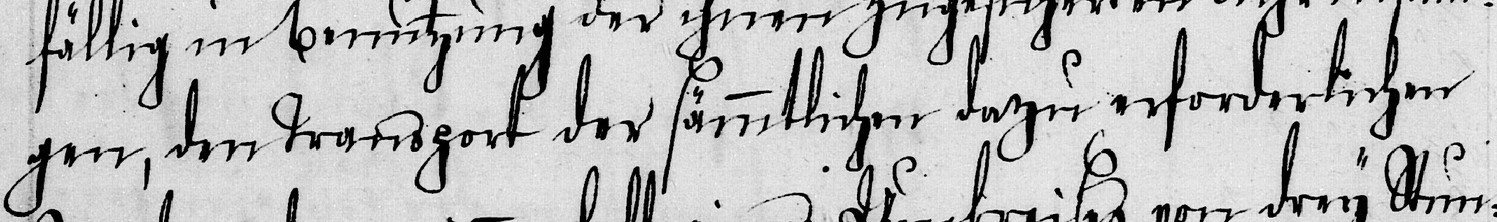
gen, den Transport der sämmtlichen dazu erforderlichen
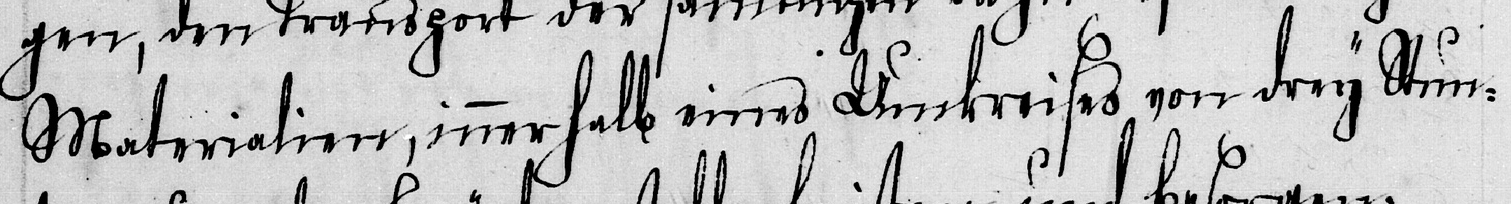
Materialien, innerhalb eines Umkreises von drey Stun¬
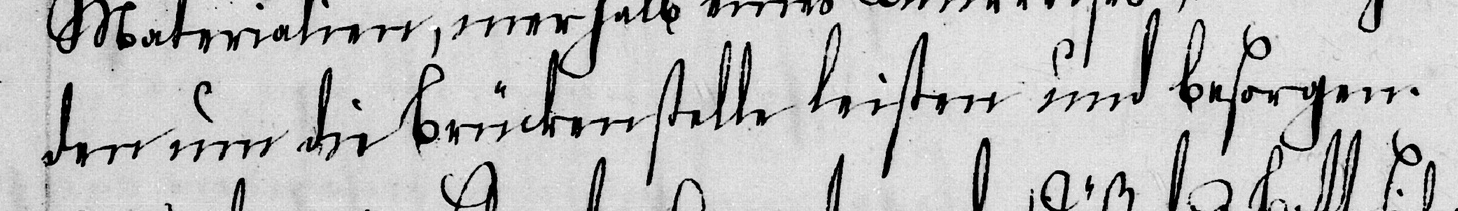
den um die Brückenstelle leisten und besorgen.
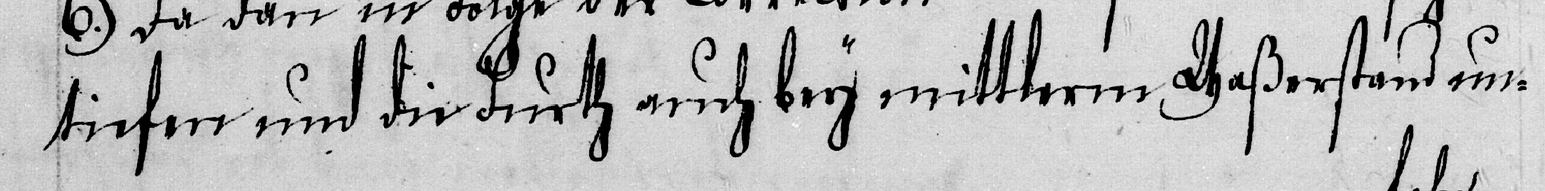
tiefen und die Furth auch bei mittlerem Waßerstand un-
